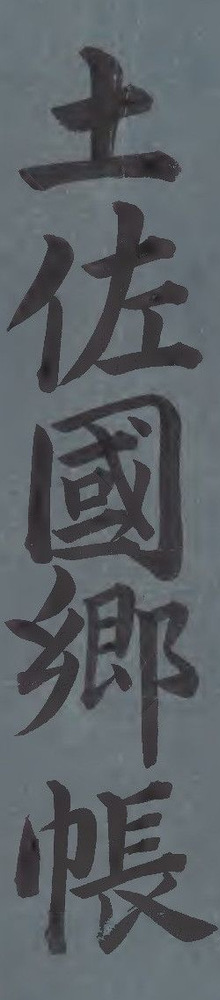土佐國郷帳

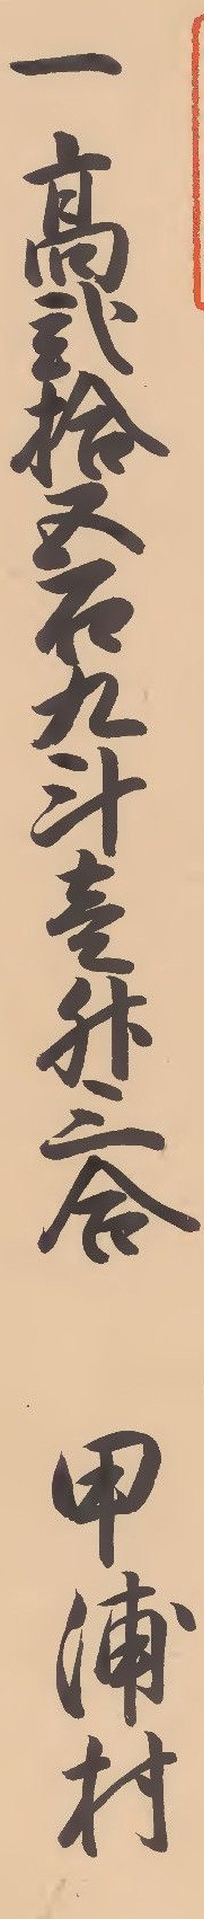一髙弐拾五石九斗壱升三合甲浦村

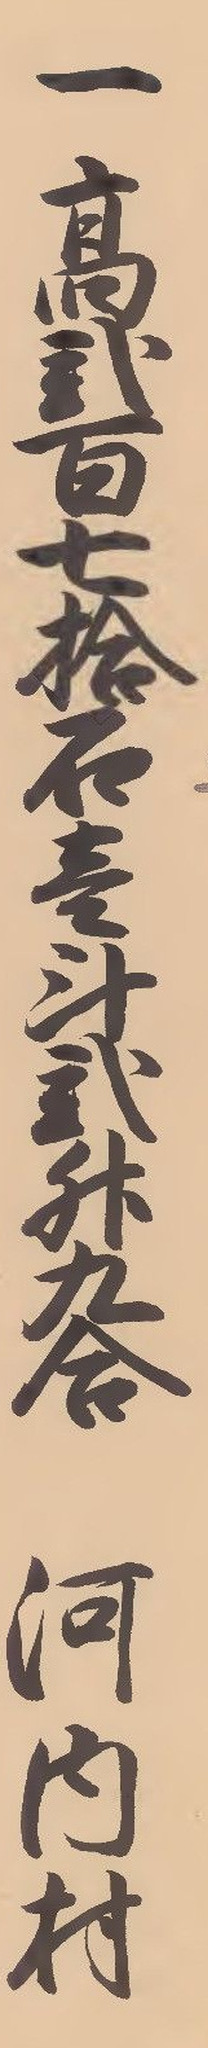一髙弐百七拾石壱斗弐升九合河内村
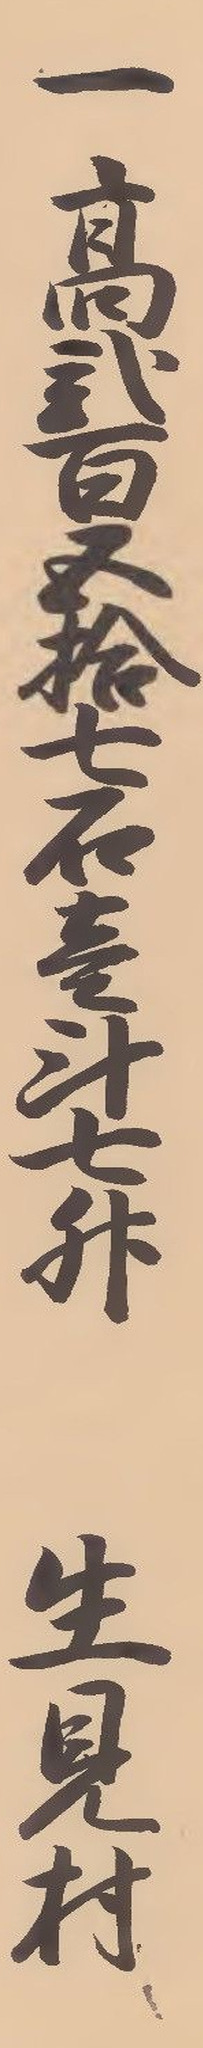一髙弐百五拾七石壱斗七升生見村
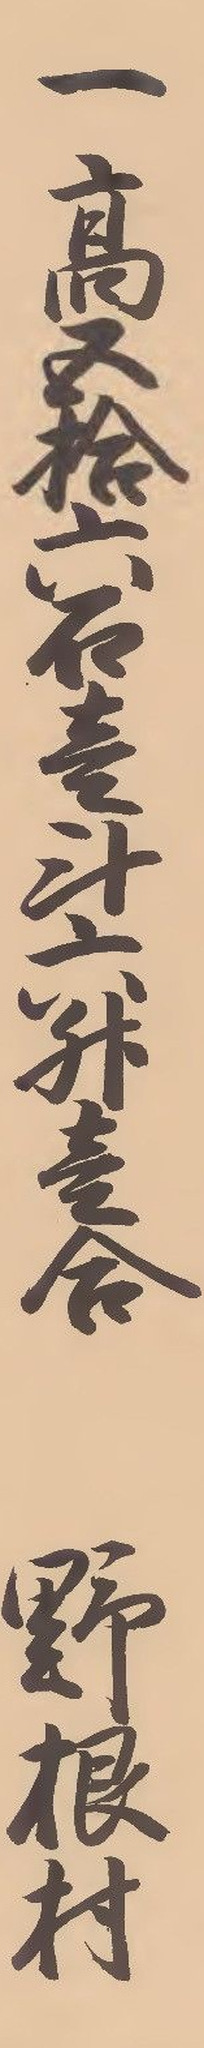一髙五拾六石壱斗六升壱合野根村
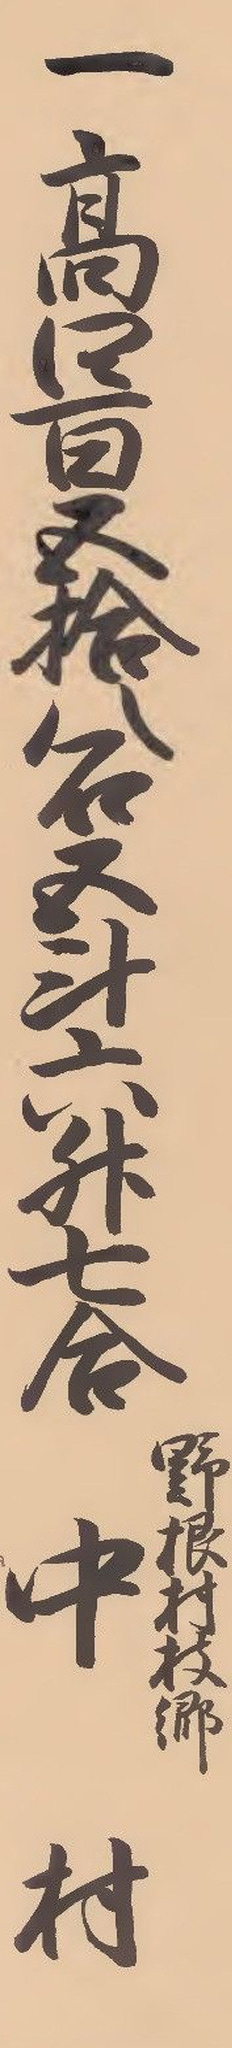一髙四百五拾八石五斗六升七合中村
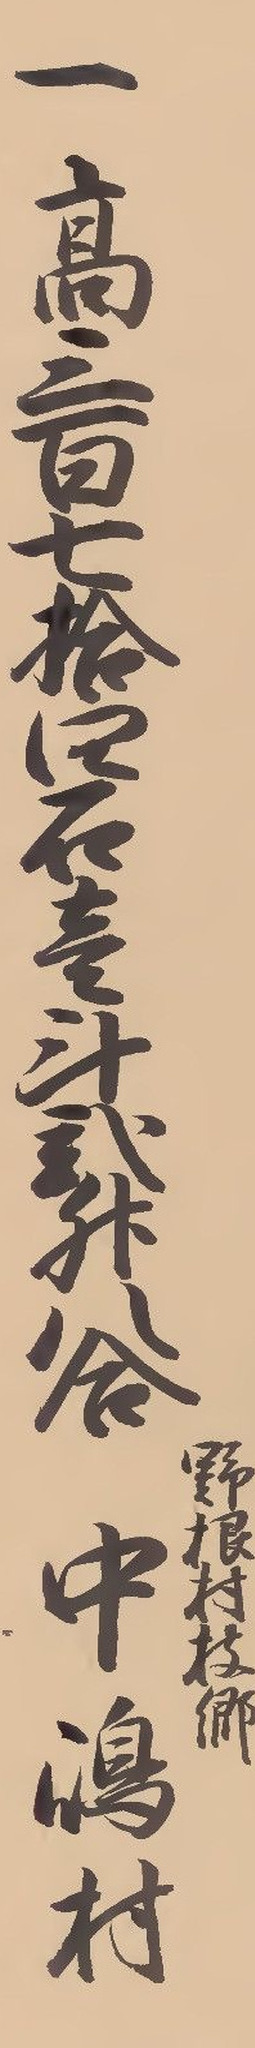一髙三百七拾四石壱斗弐升八合中島村
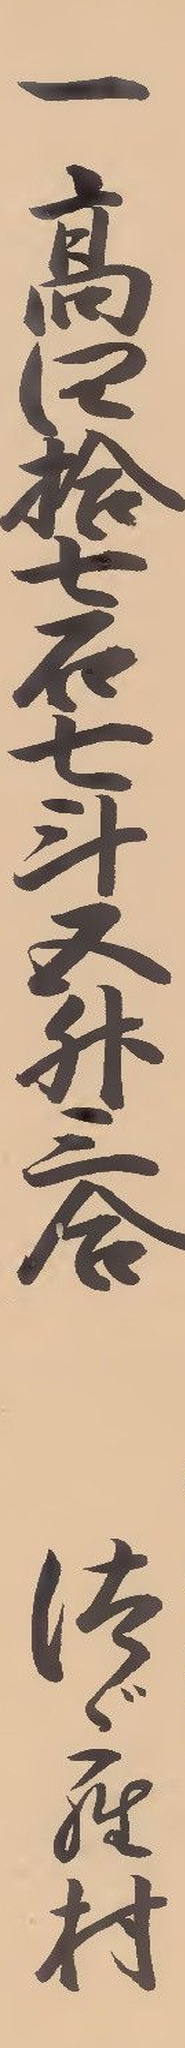一髙四拾七石七斗五升三合村
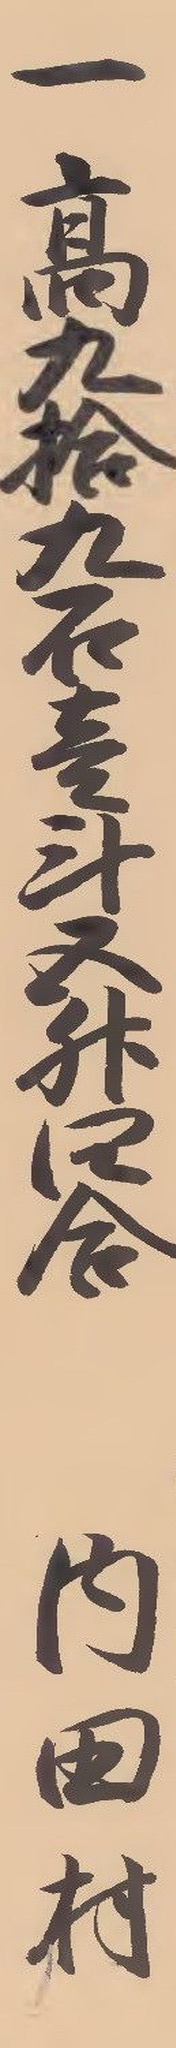一髙九拾九石壱斗五升四合内田村
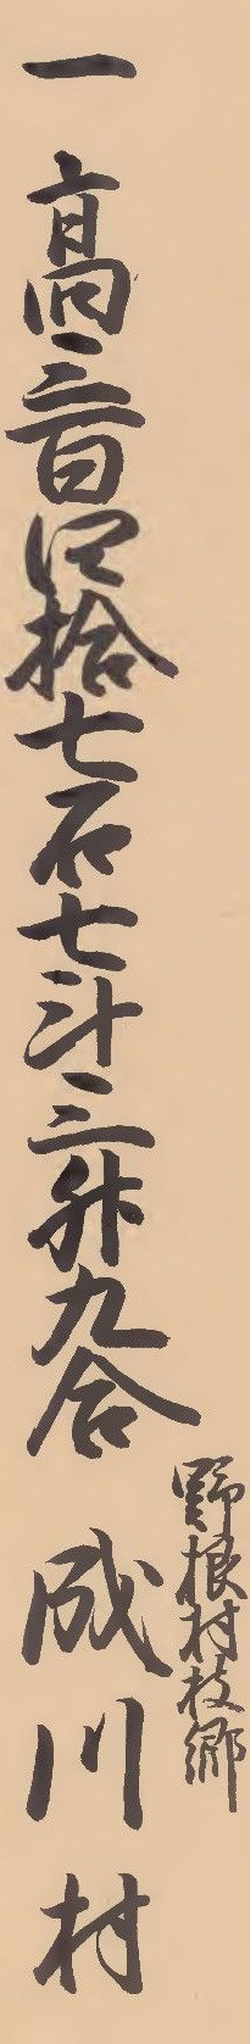一髙三百四拾七石七斗三升九合成川村

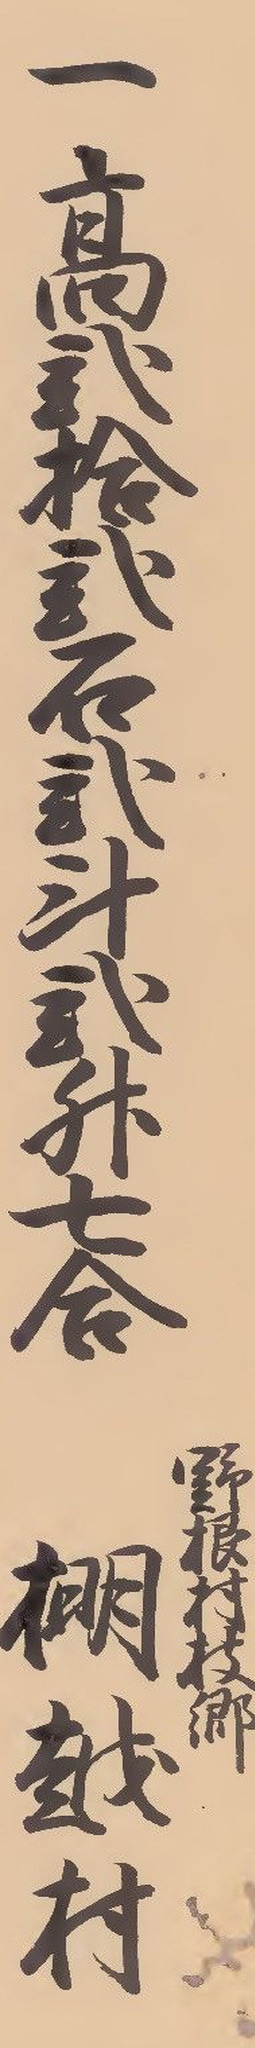一髙弐拾弐石弐斗弐升七合棚越村
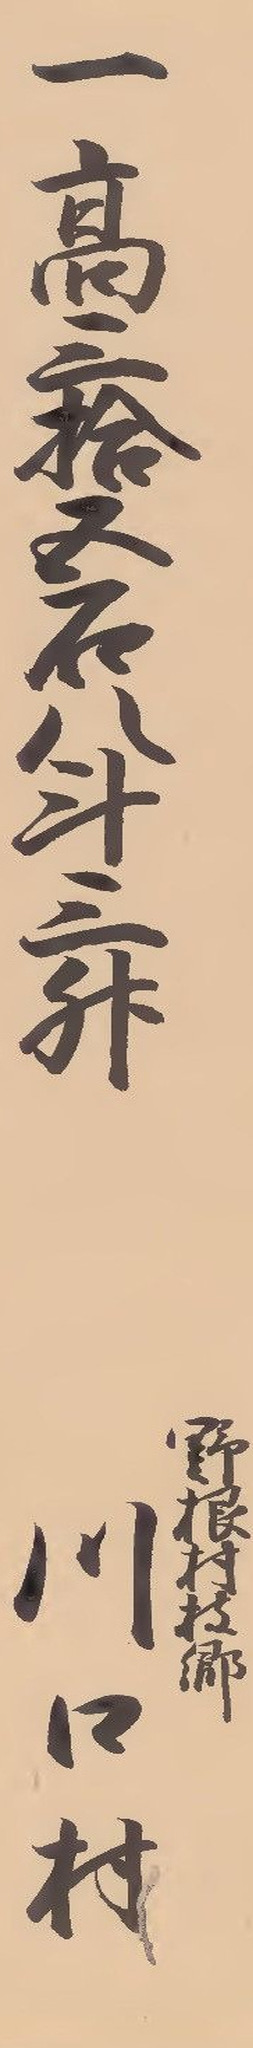一髙三拾五石八斗三升川口村
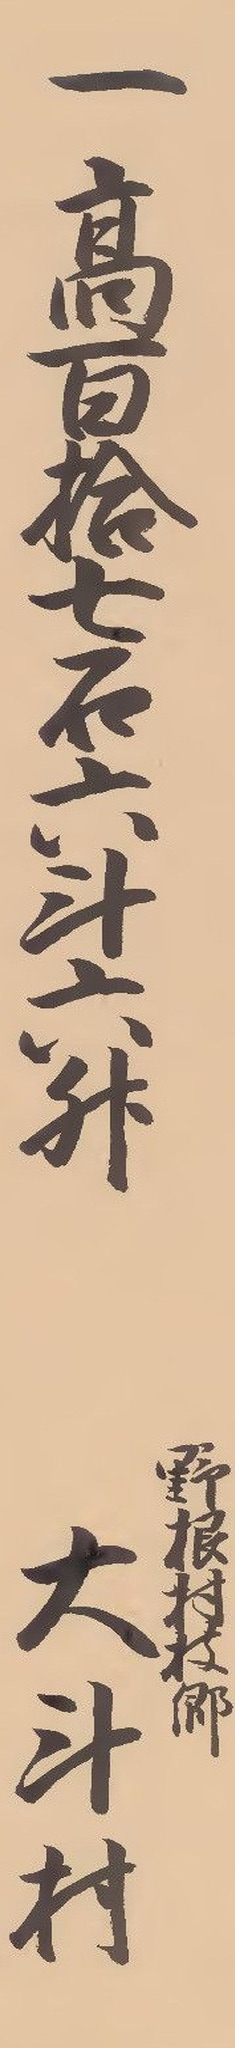一髙百拾七石六斗六升大斗村
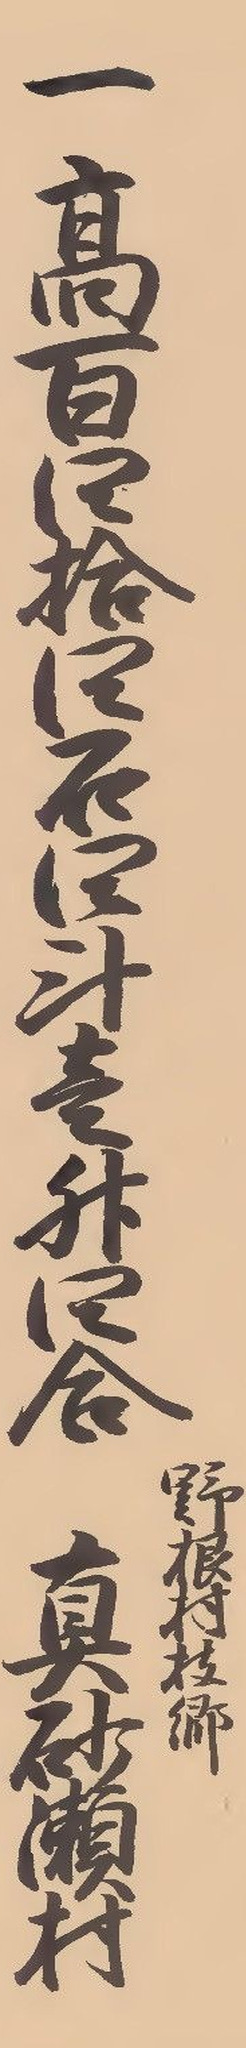一髙百四拾四石四斗壱升四合真砂瀬村
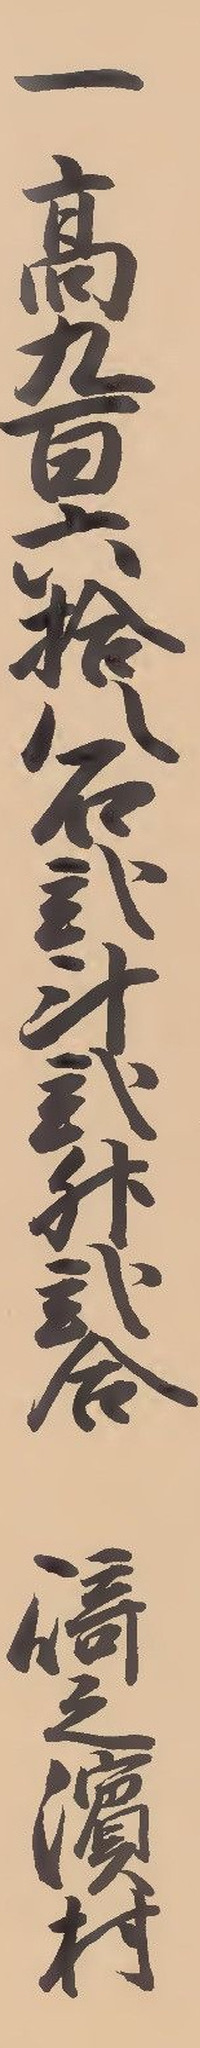一髙九百六拾八石弐斗弐升弐合崎之濱村
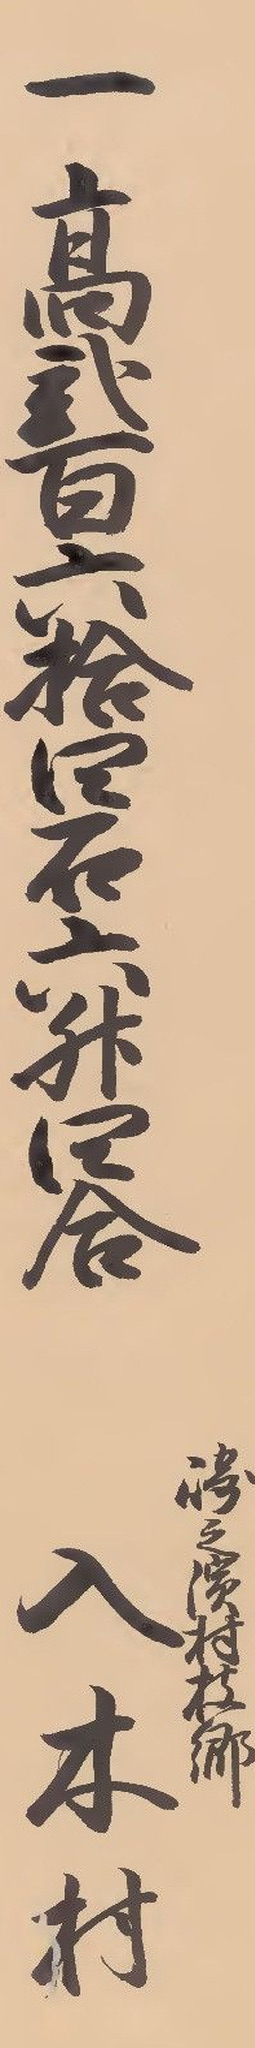一髙弐百六拾四石六升四合木入村
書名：土佐国郷帳
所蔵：国立公文書館 National Archives of Japan
